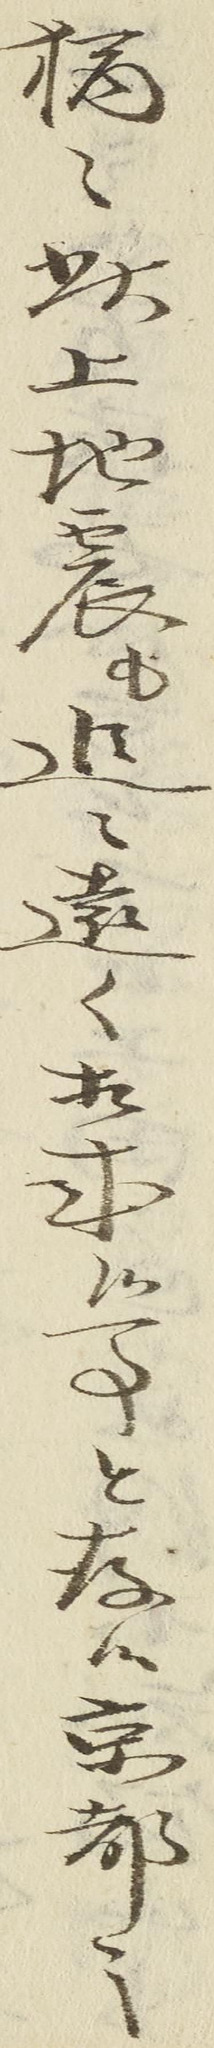尚々此上地震も追々遠く相成候事と存候京都之
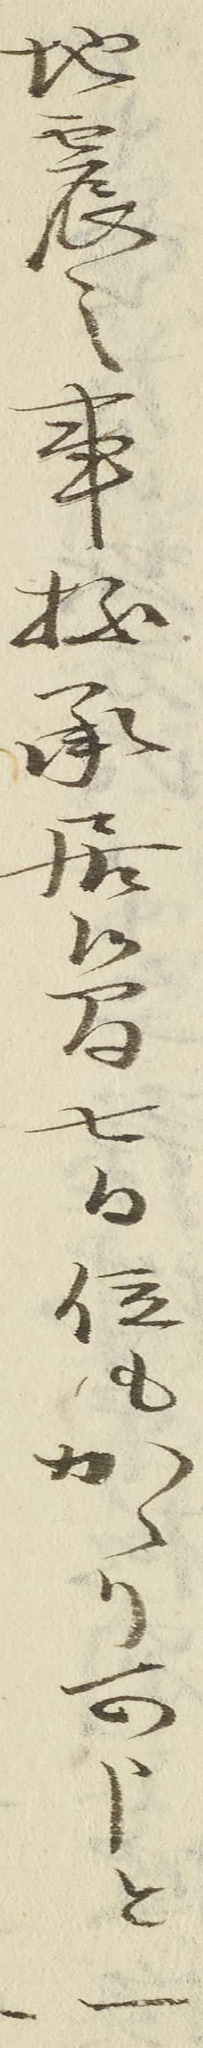地震之事抔承居候間七日位もかゝり可申と最早一
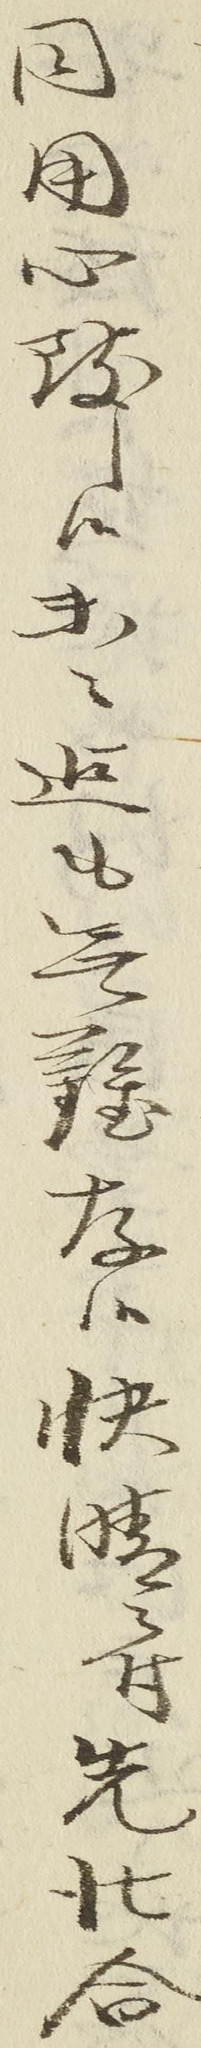同用心致候未々迄も無難存候快晴二付先仕合
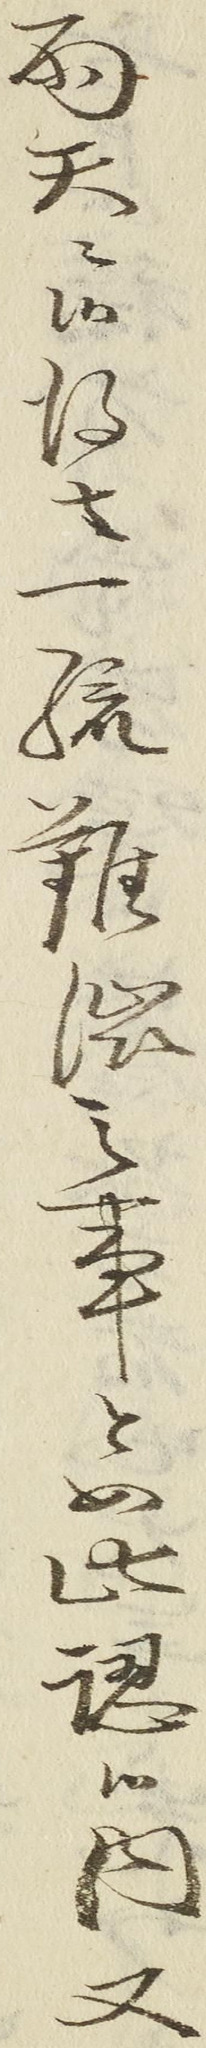雨天二候得は一統難渋之事と如此認候内又
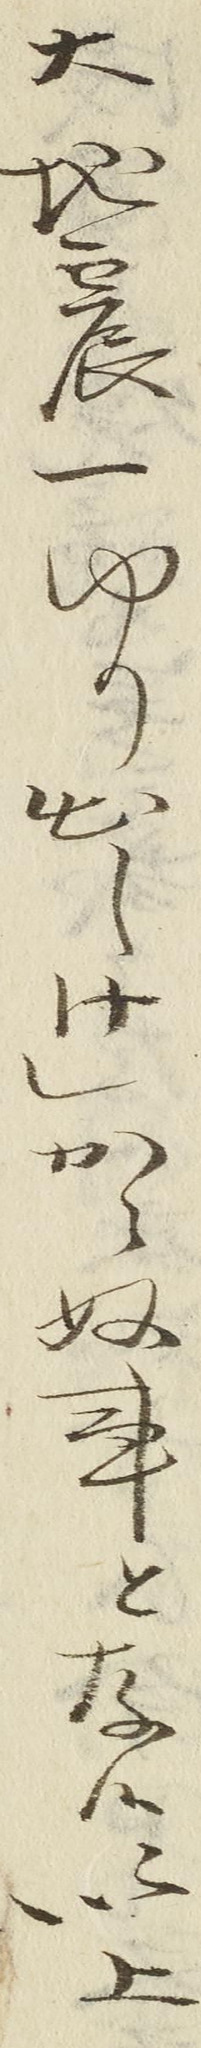大地震一ゆり出しけしからぬ事と存候巳以上
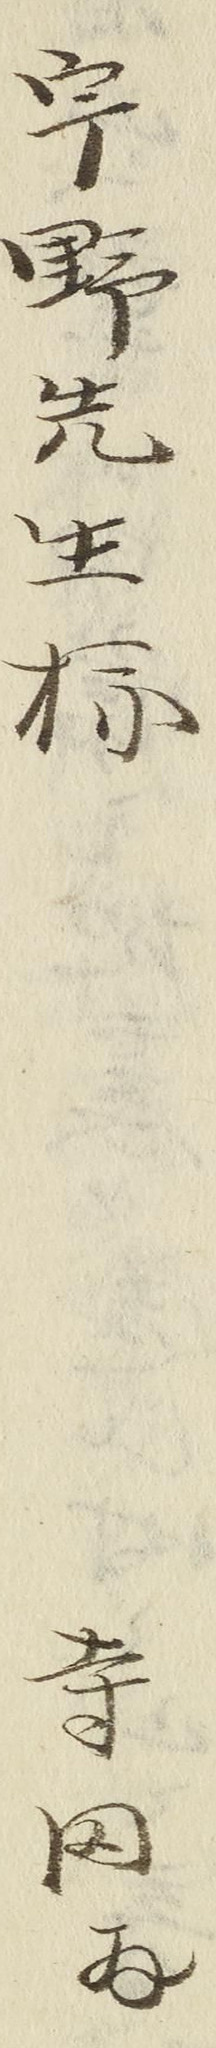宇野先生様寺田拝
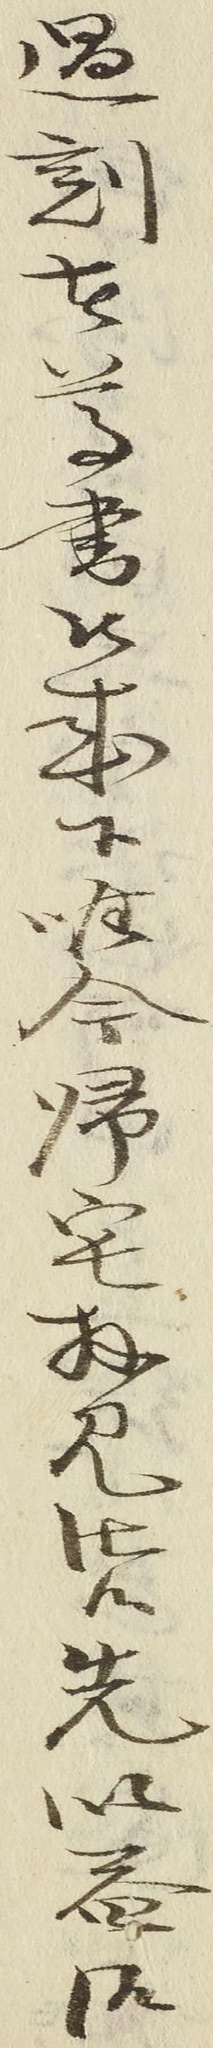過刻は尊書被成下唯今帰宅拝見仕候先以益御
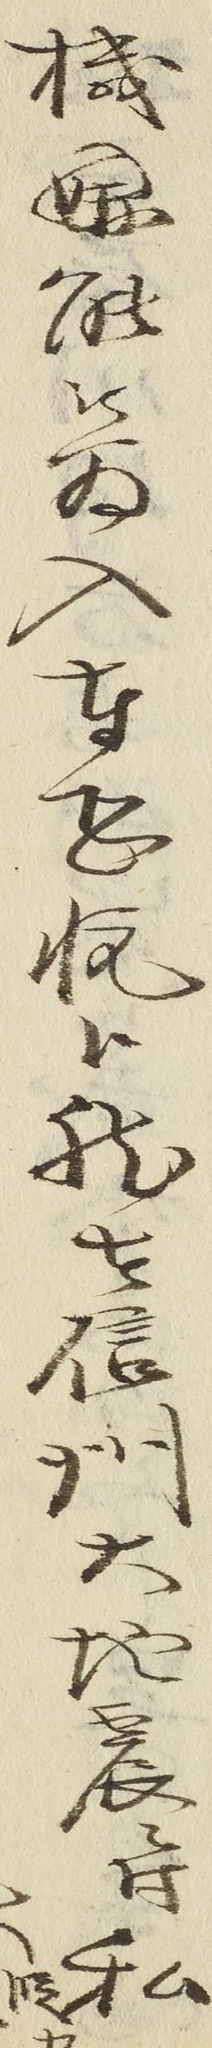機嫌能被為入奉恐悦候然は信州大地震二付私
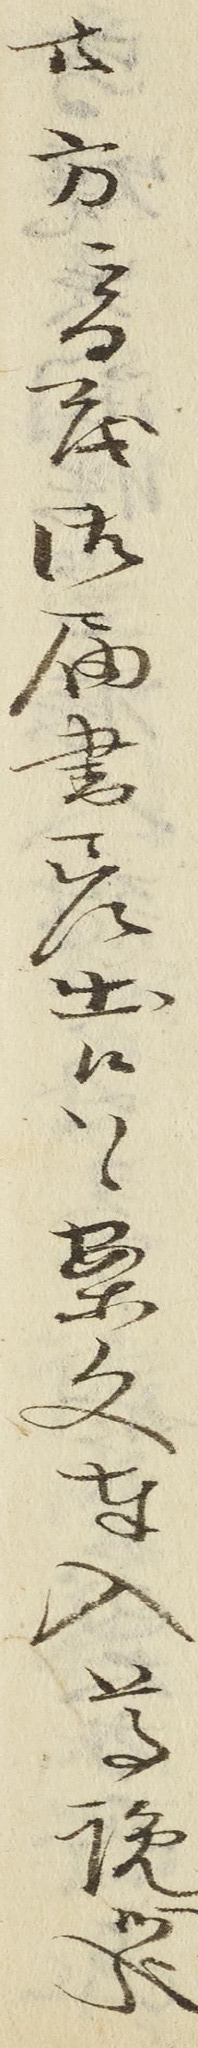方二而も御届書差出候ハゝ案文奉入尊読段候哉
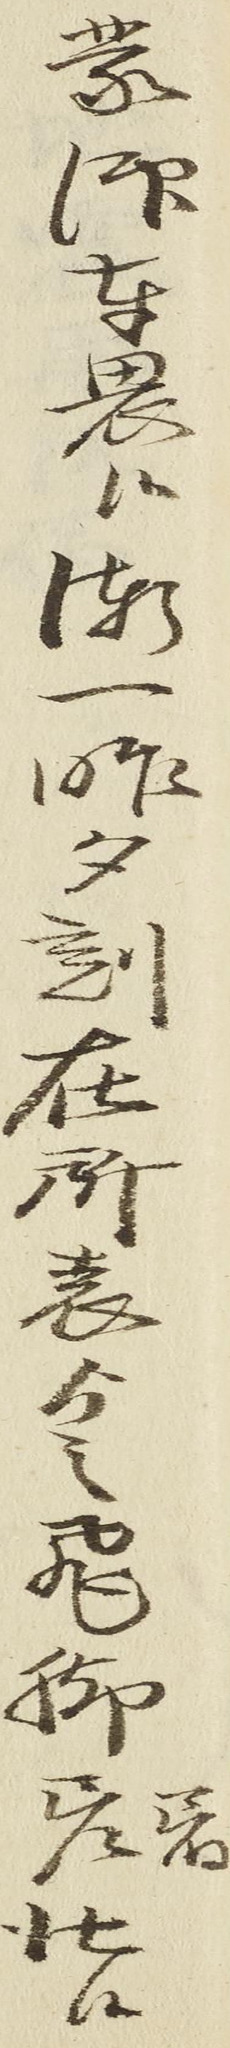蒙仰奉畏候漸一昨夕刻在所表ゟ之飛脚着仕候
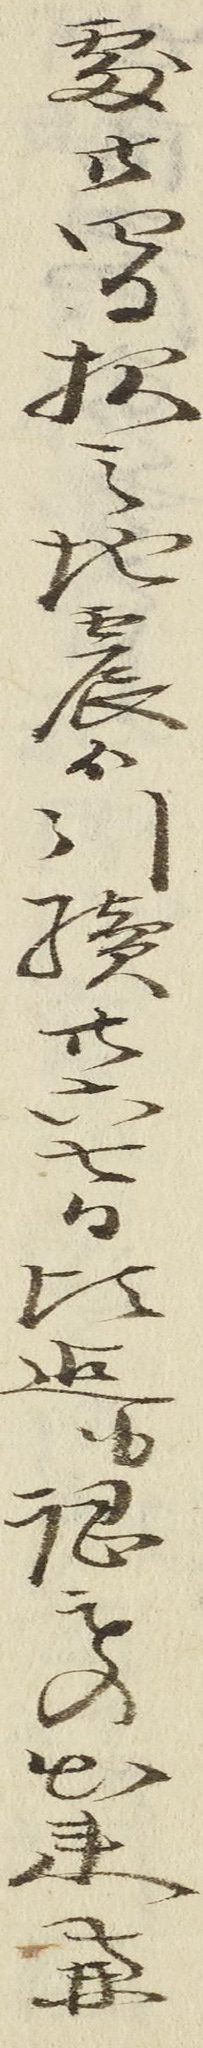処廿四日夜之地震ゟ引続廿六七日頃迄も認もの出来兼
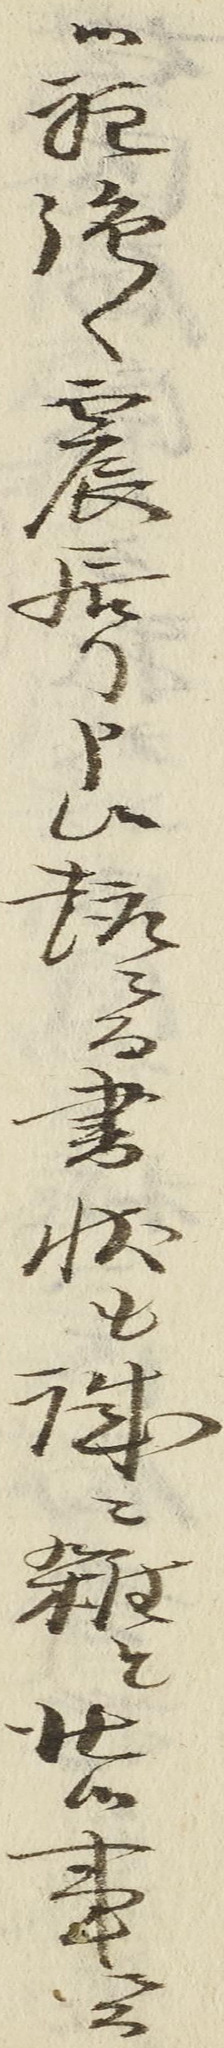候程強く震居り申候趣二而書状も誠二雑と仕候事二而
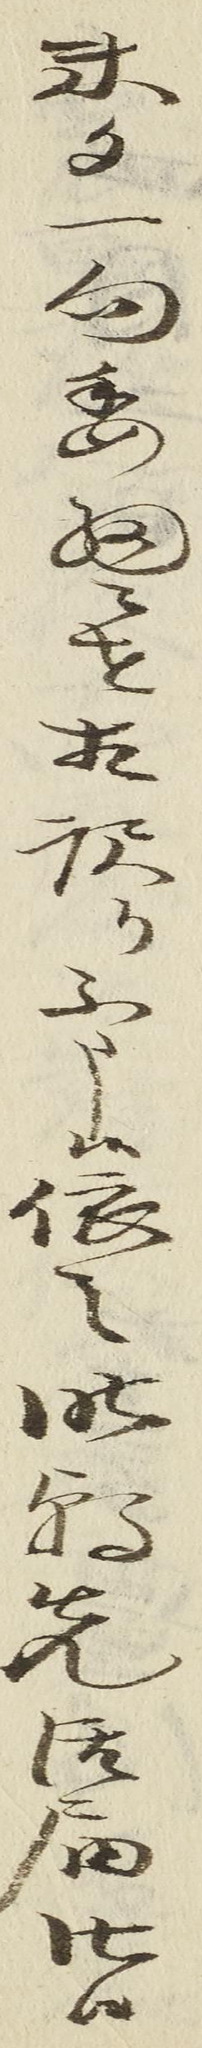未タ一向委細二は相訳り不申候依之昨朝先御届仕候
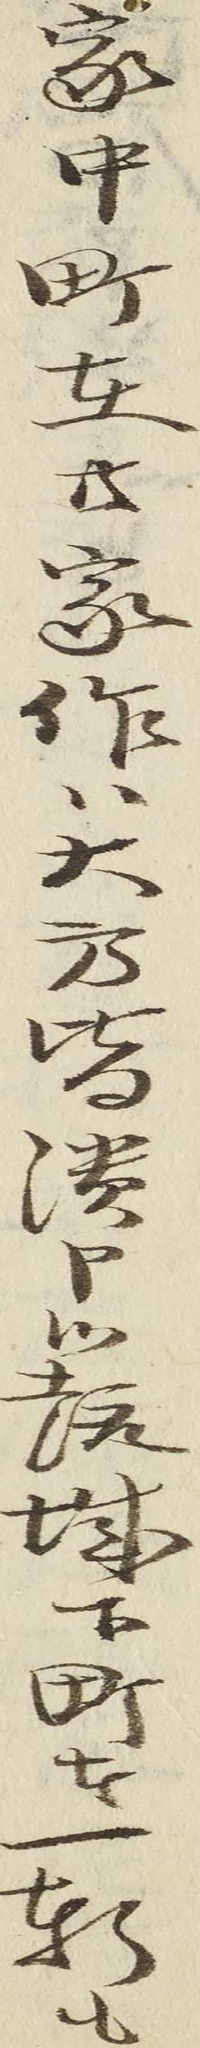家中町在共家作ハ大方皆潰申候趣城下町は一軒も
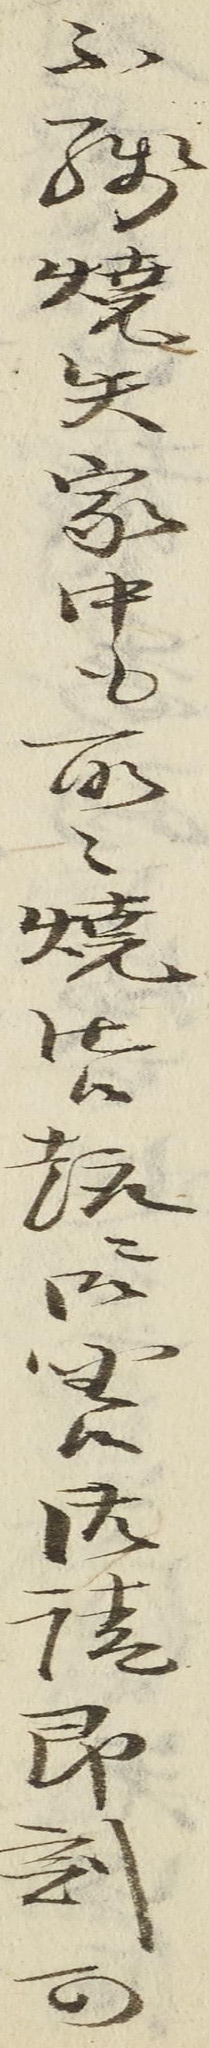不残焼失家中も所々焼仕候趣二御坐候御請即刻可
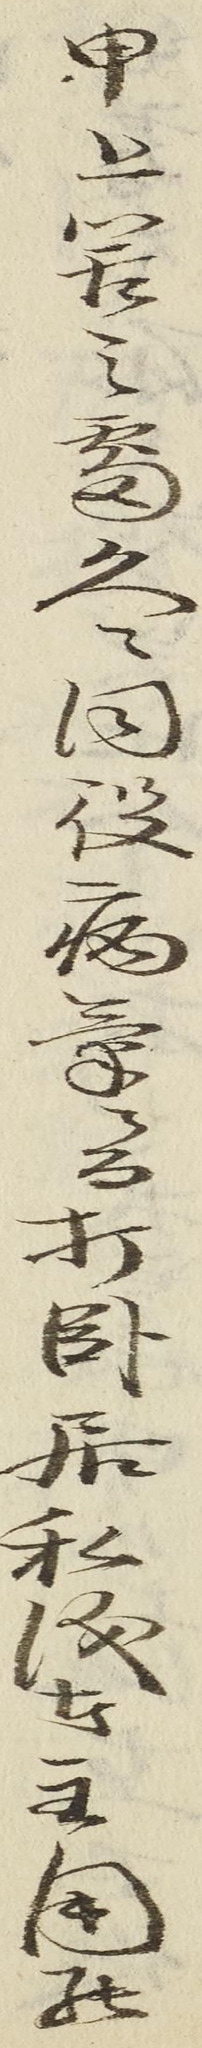申上筈之処久々同役病気二而打臥居私儀は主用罷
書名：信濃國大地震記　乾
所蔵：東京大学地震研究所図書室 Earthquake Research Institute Library, The University of Tokyo, JAPAN
